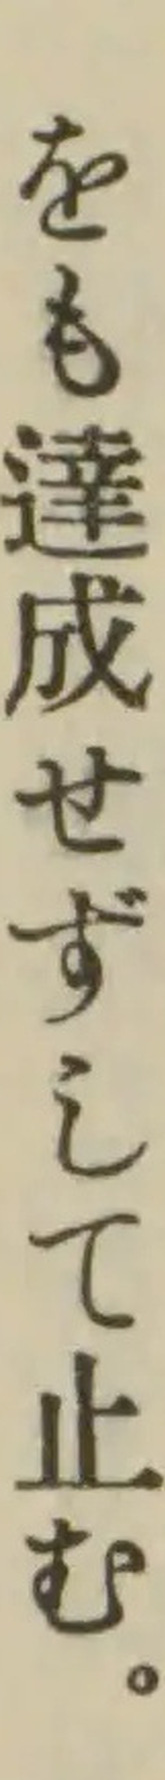をも達成せずして止む。
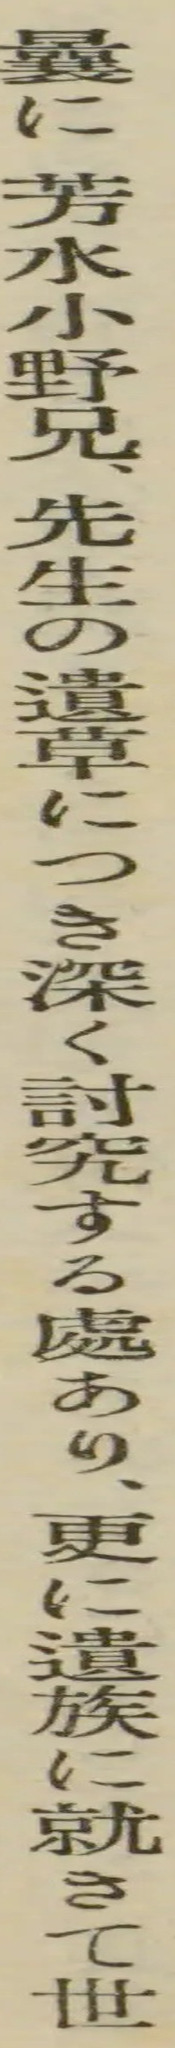曩に芳水小野兄、先生の遺草につき深く討究する処あり、更に遺族に就きて世
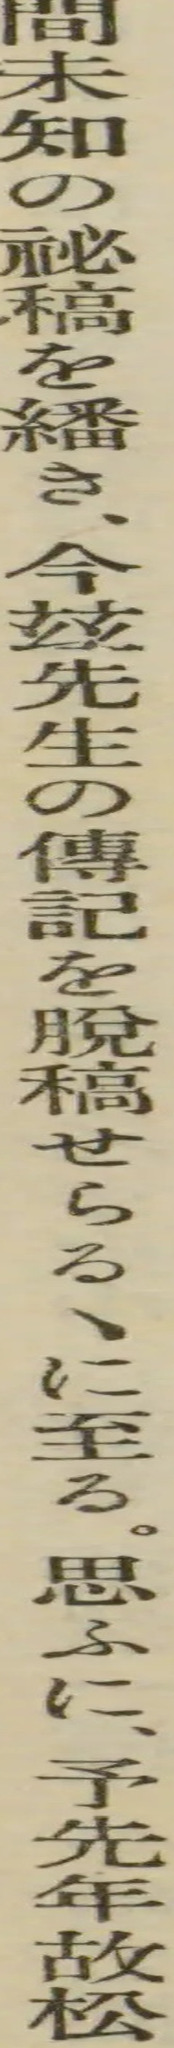間未知の秘稿を繙き、今茲先生の伝記を脱稿せらるゝに至る。思ふに、予先年故松
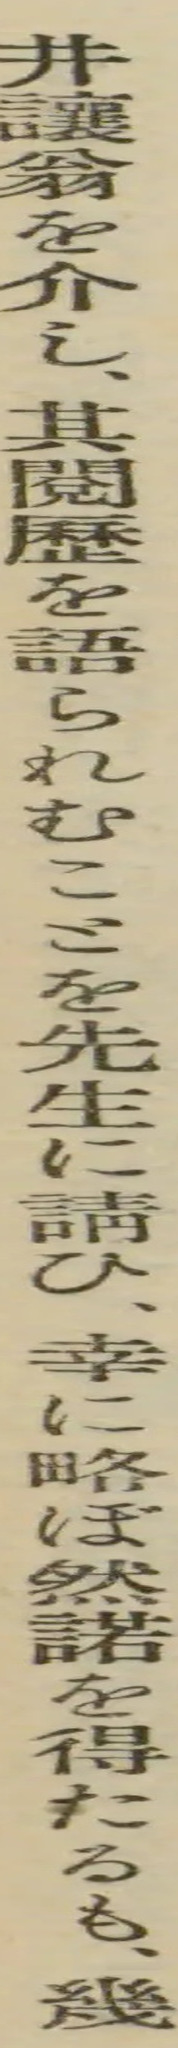井讓翁を介し、其閲歴を語られむことを先生に請ひ、幸に略ぼ然諾を得たるも、幾

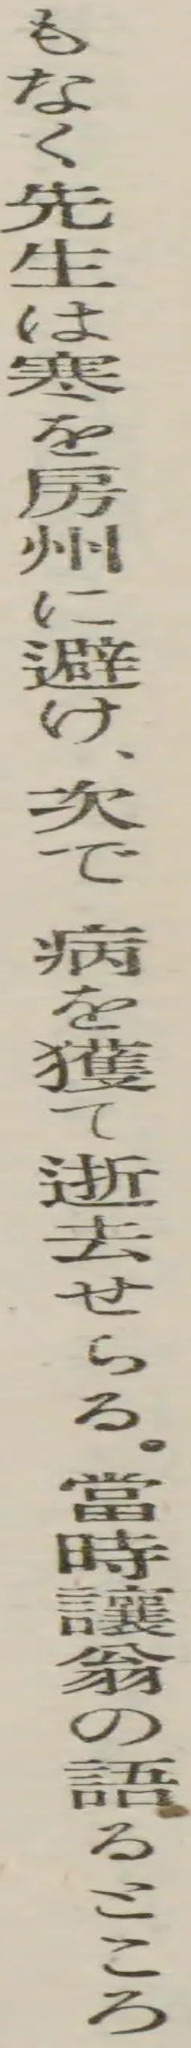もなく先生は寒を房州に避け、次で病を獲て逝去せらる。当時讓翁の語るところ
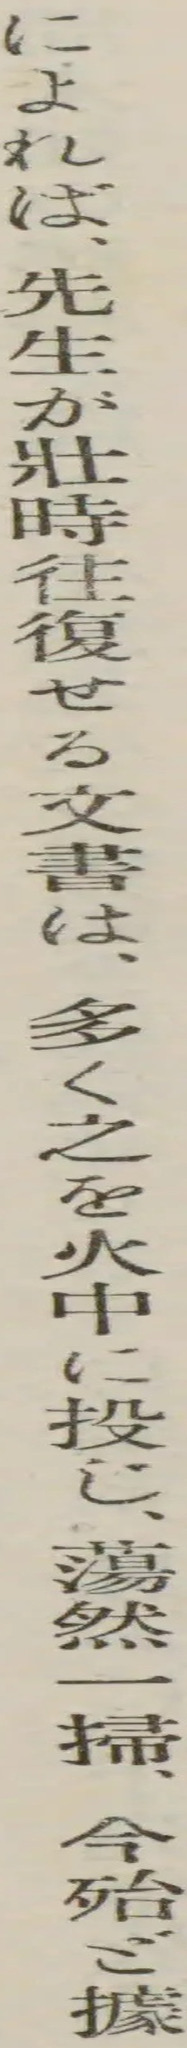によれば、先生が壮時往復せる文書は、多く之を火中に投じ、蕩然一掃、今殆ど拠
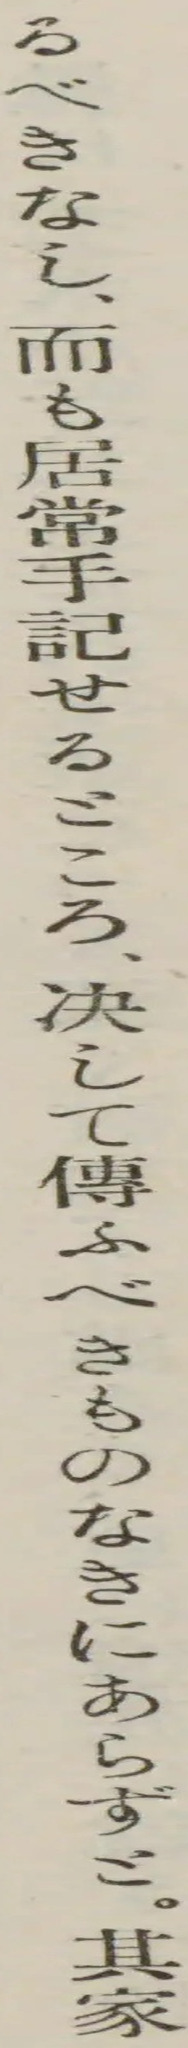るべきなし、而も居常手記せるところ、決して伝ふべきものなきにあらずと。其家
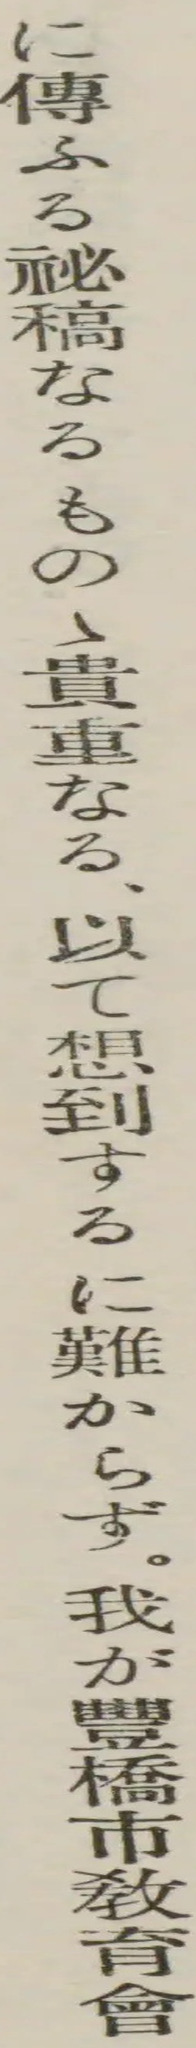に伝ふる秘稿なるものゝ貴重なる、以て想到するに難からず。我が豊橋教育会
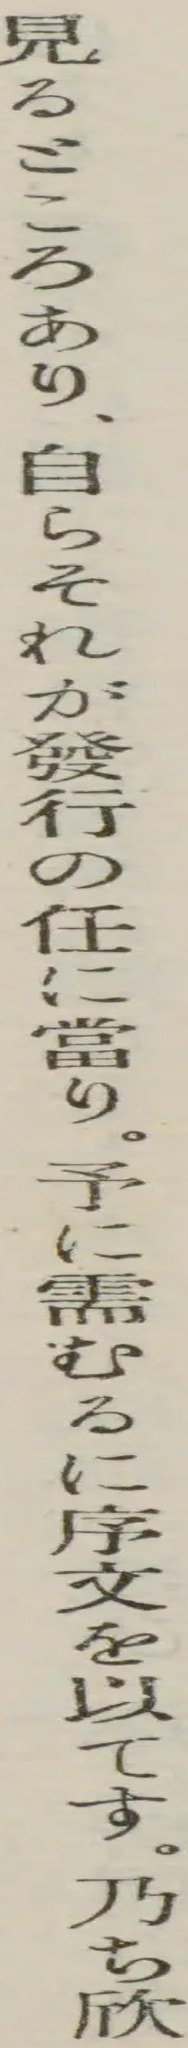見るところあり、自らそれが発行の任に当り。予に需むるに序文を以てす。乃ち欣
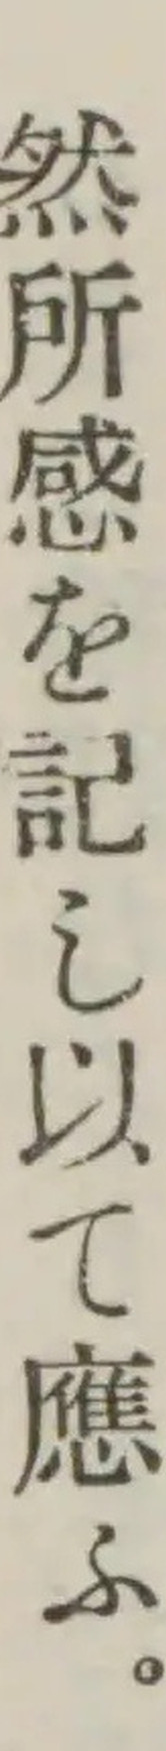然処感を記し以て応ふ。
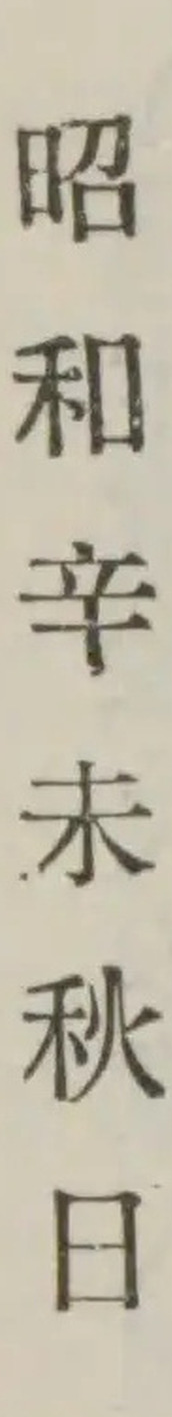昭和辛未秋日
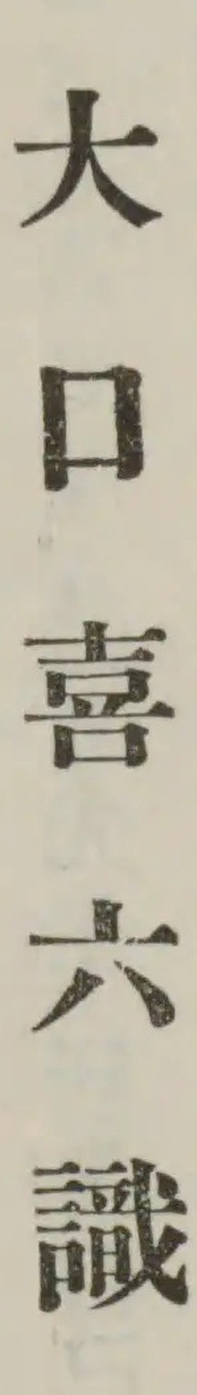大口喜六識
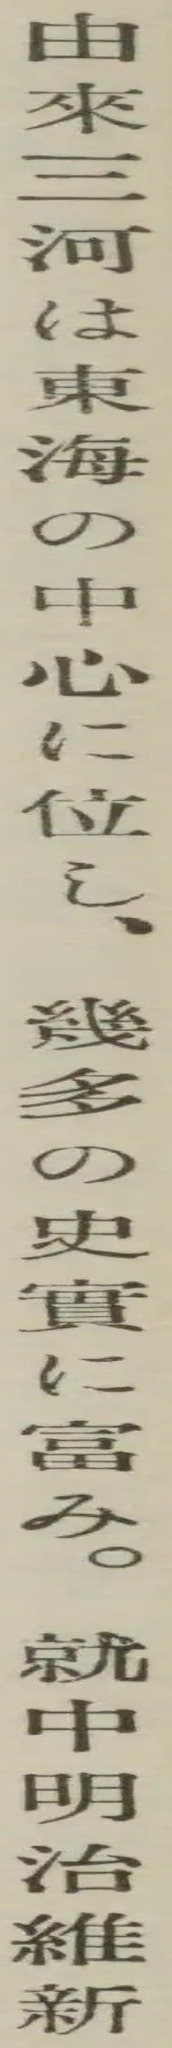由来三河は東海の中心に位し、幾多の史実に富み。就中明治維新
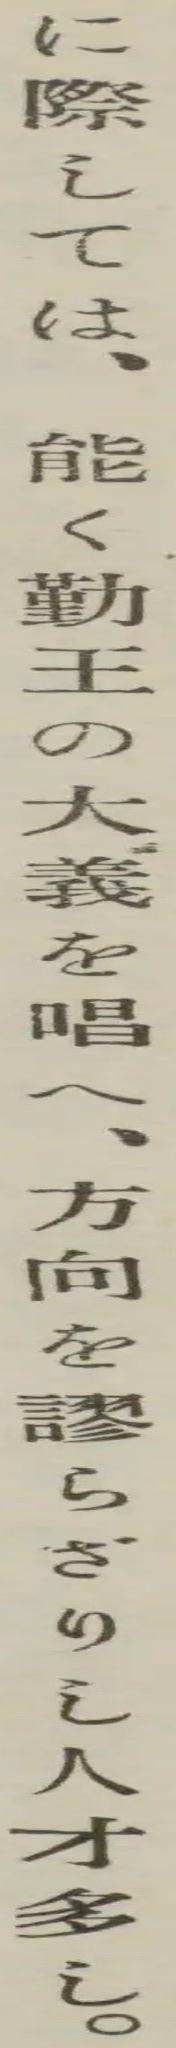に際しては、能く勤王の大義を唱へ、方向を謬らざりし人才多し。
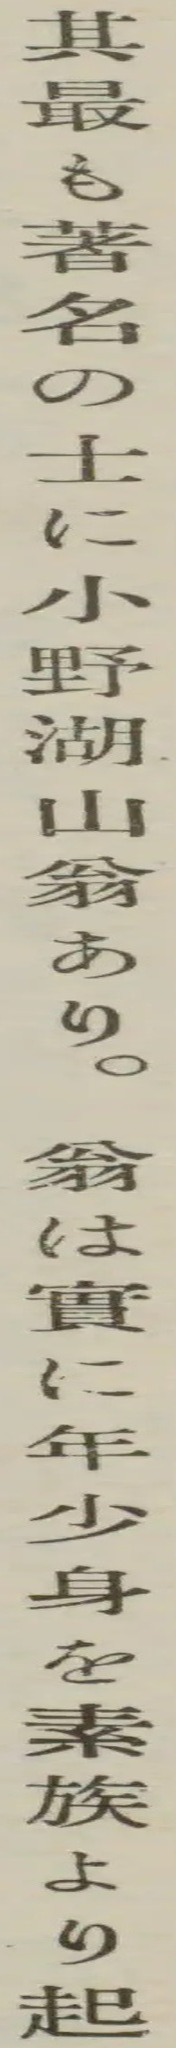其最も著名の士に小野湖山翁あり。翁は実に年少身を素族より起
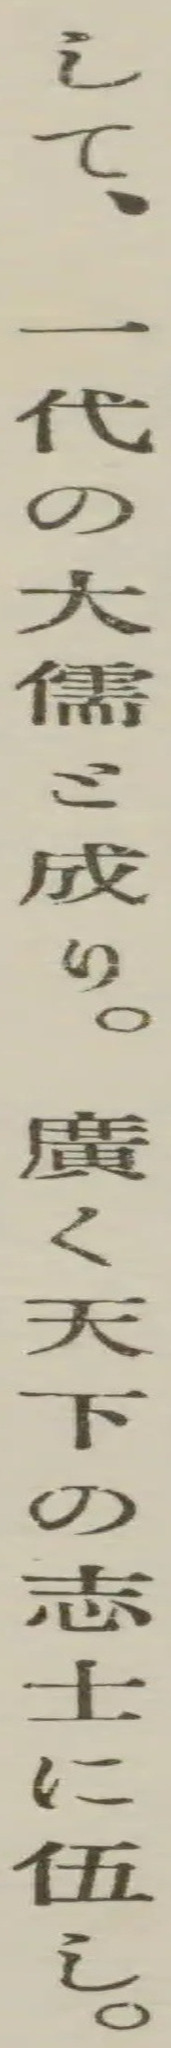して、一代の大儒と成り。広く天下の志士に伍し。
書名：小野湖山翁小伝
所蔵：国立国会図書館 National Diet Library, JAPAN
